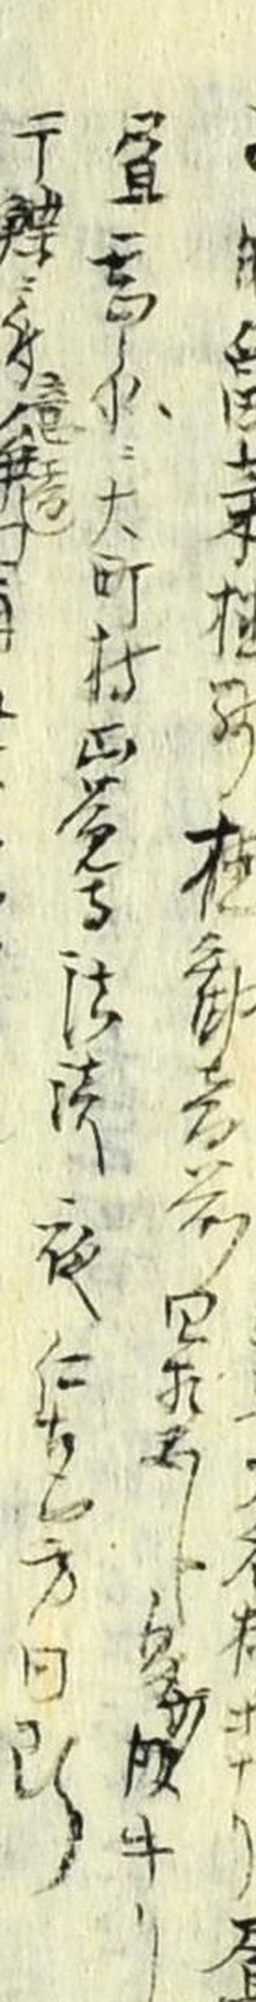昼甚兵衛ニ大町村正覚寺法談夜仁左衛門方同断
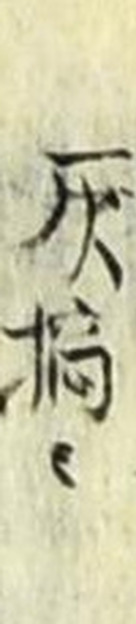灰摘候
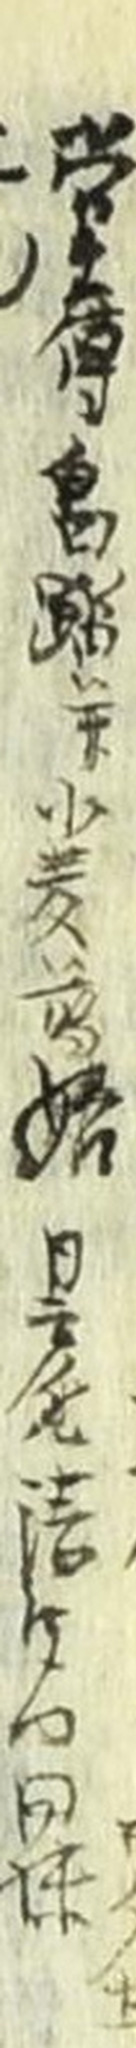堂伝畠踏幷小麦蒔始日雇清左衛門同様
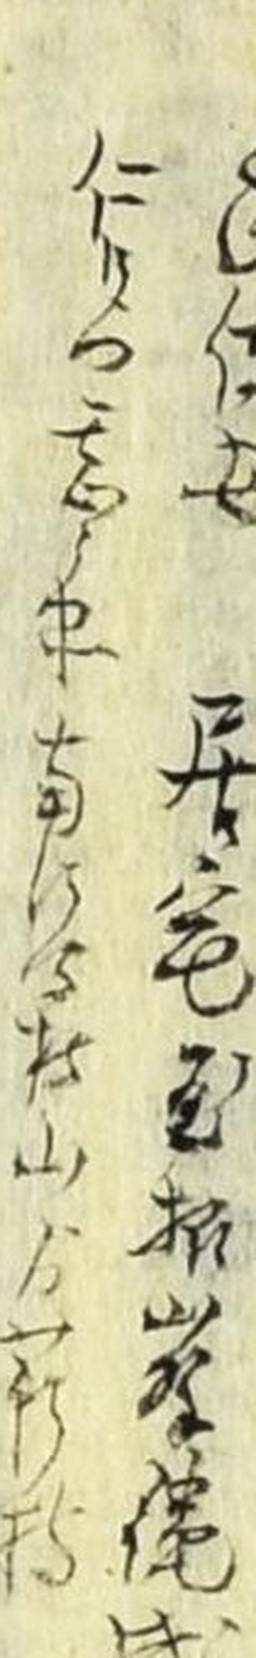仁左右衛門甚兵衛南江守持山ゟ薪持
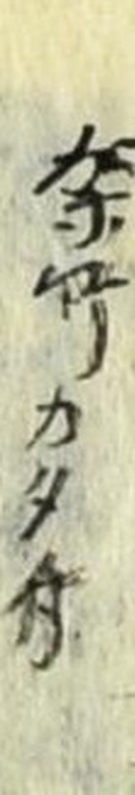架竹カタ付
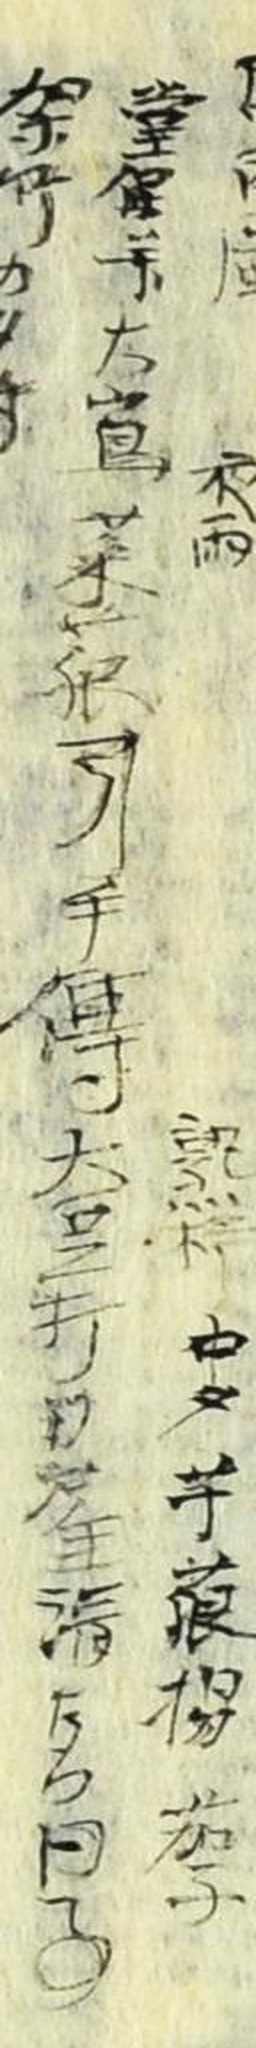堂保幷大島菜菔引手伝大豆打日雇清左衛門同事
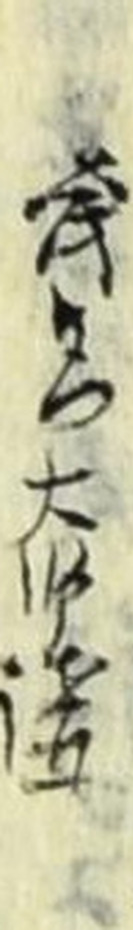茂左衛門大師講
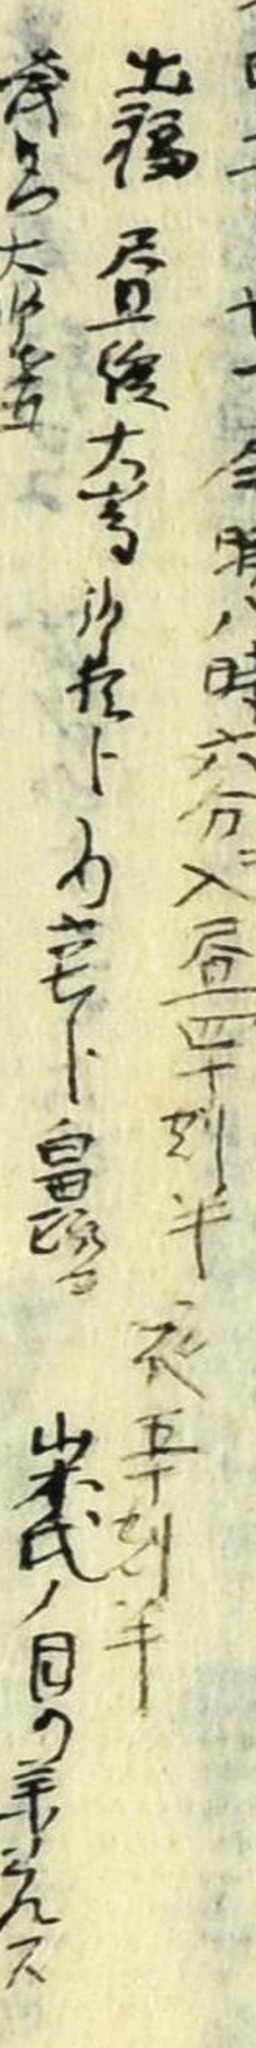出福昼後大島弐拾歩之内六七歩畠踏山本氏ノ目の薬差ス
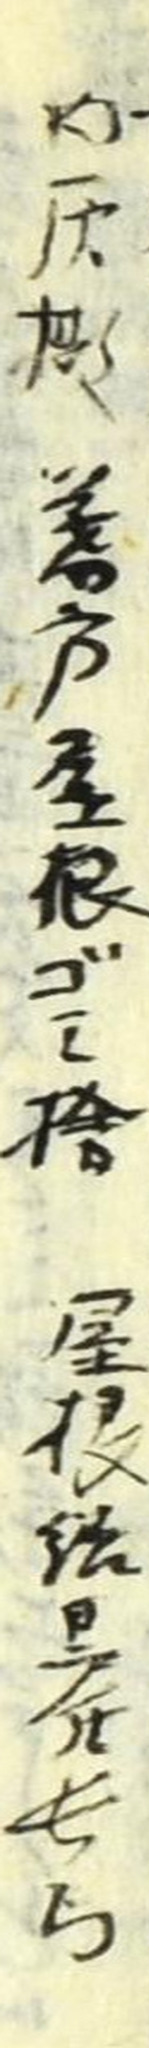内灰撒暮方屋根ゴミ捨屋根繕日雇長右衛門

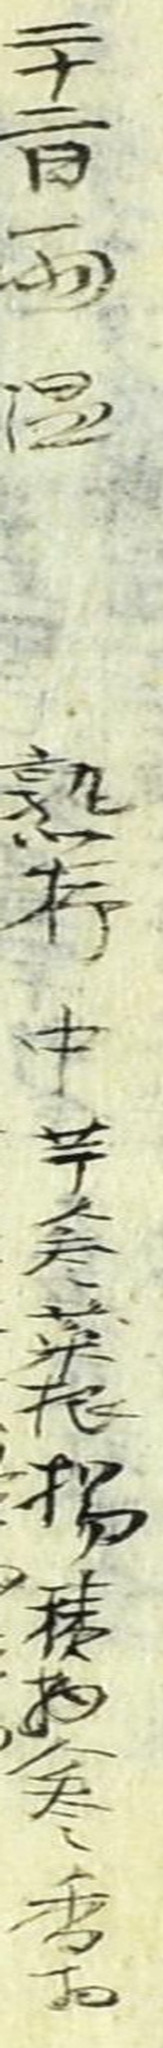二十二日雨温熟柿中芋人参菜根揚積物人参香物
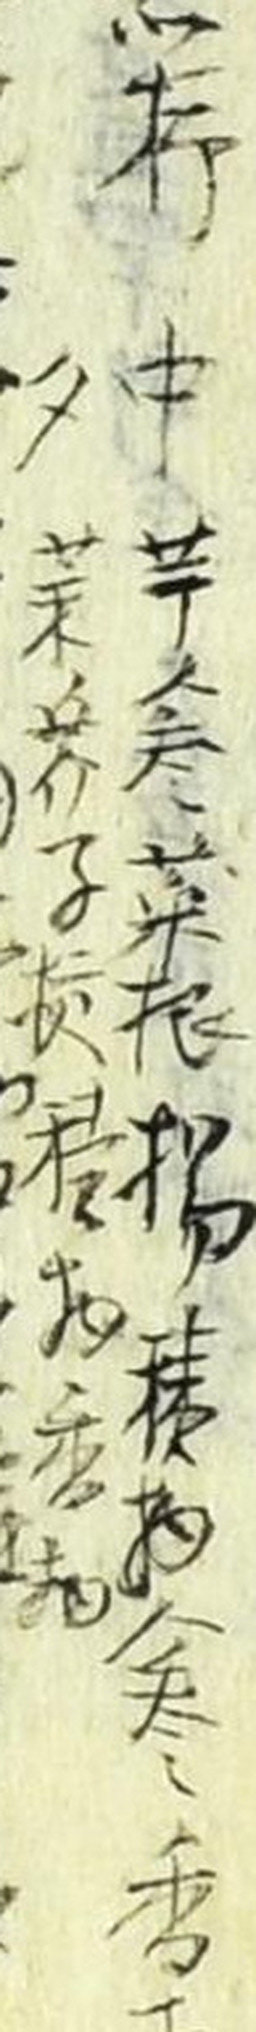夕菜ノ芥子挍積物香物
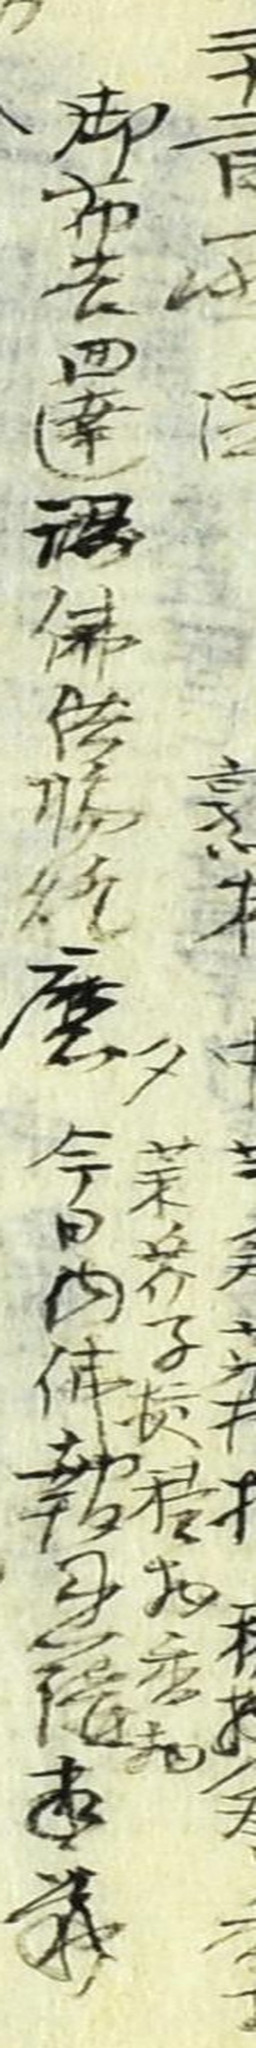御布告回達認仏供輪灯磨今日内仏報恩講「相頼」
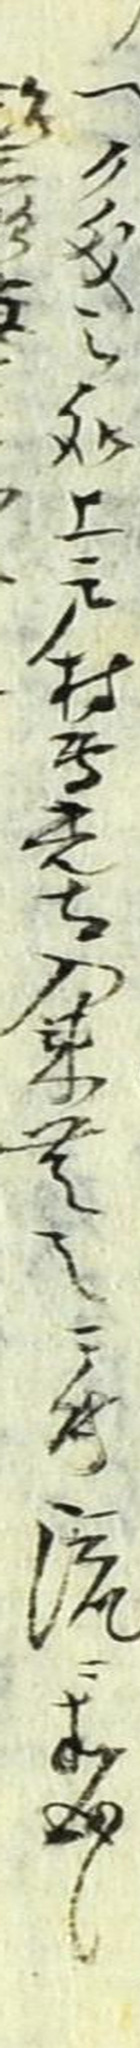ヘク義之処上戸村専光寺入来無之ニ付流ニ相成候
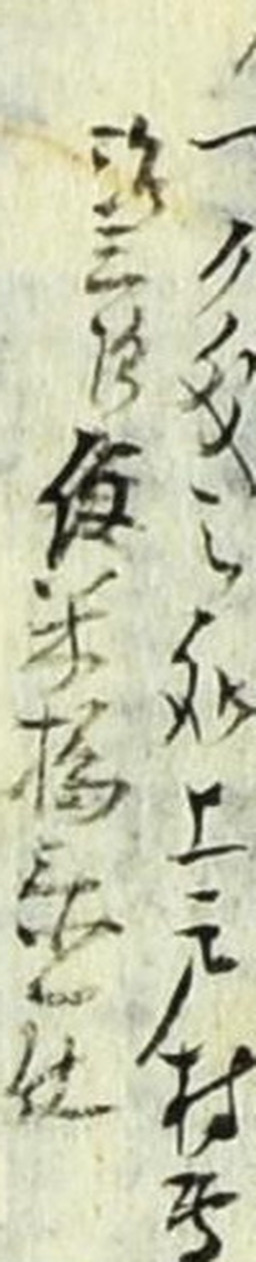治三次飯米搗置仕
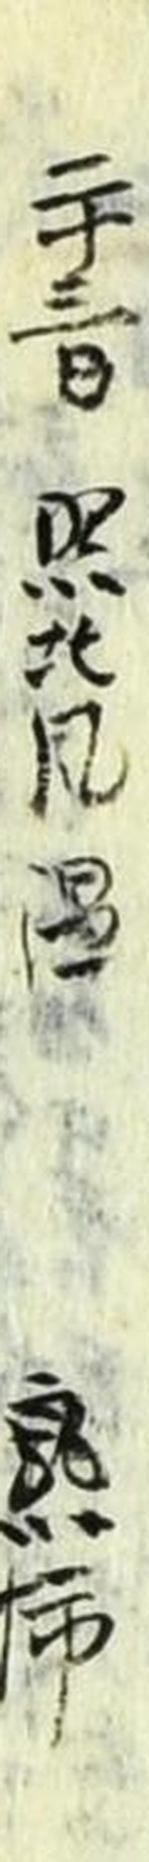二十三日照北風温熟柿
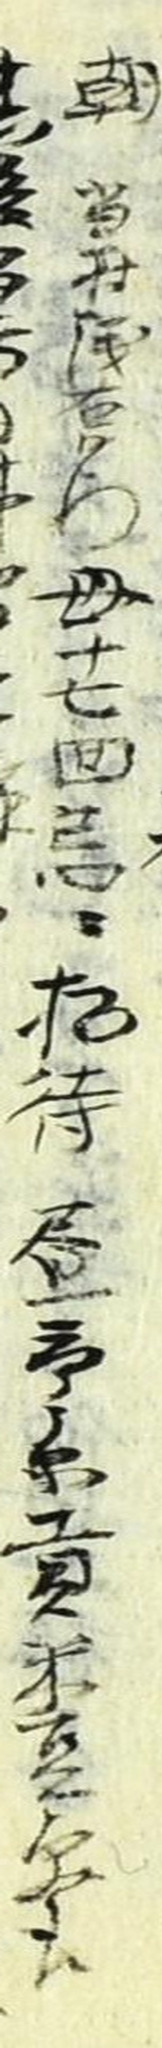朝当村浅右衛門母十七回忌ニ招待昼市兵衛貢米豆受取
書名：（日記）
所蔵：福井県文書館 Fukui Prefectural Archives
